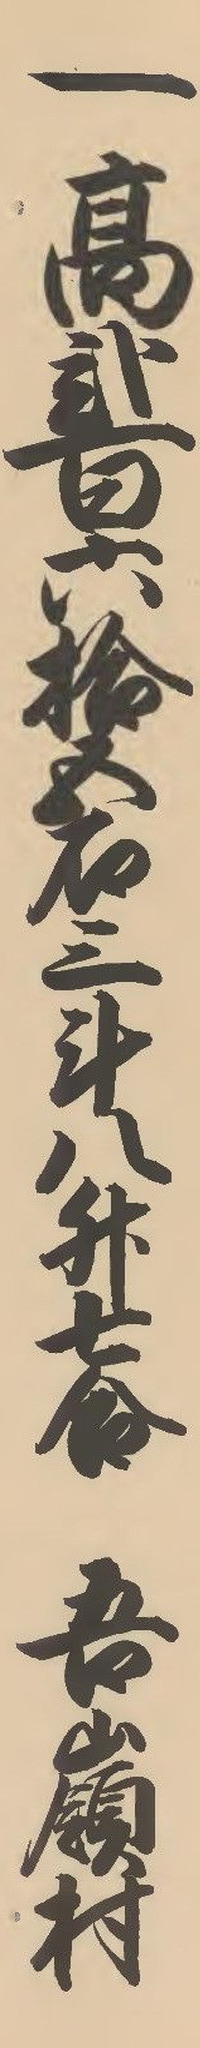一髙弐百六拾五石三斗八升七合吾領村
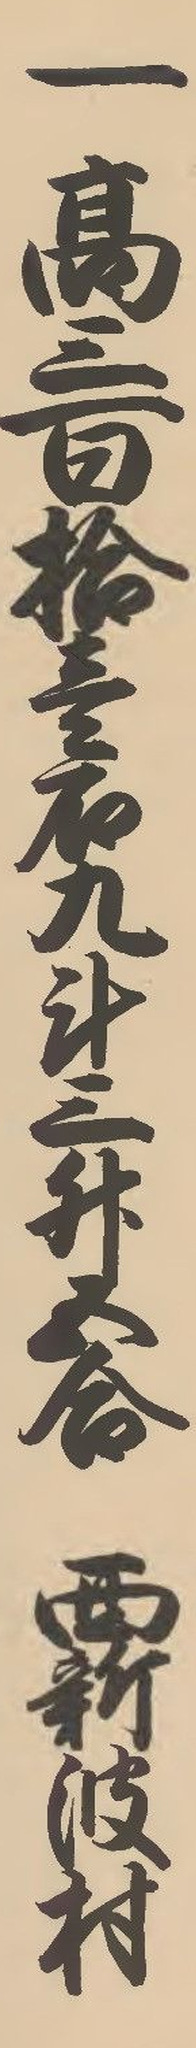一髙三百拾壱石九斗三升五合西新波村
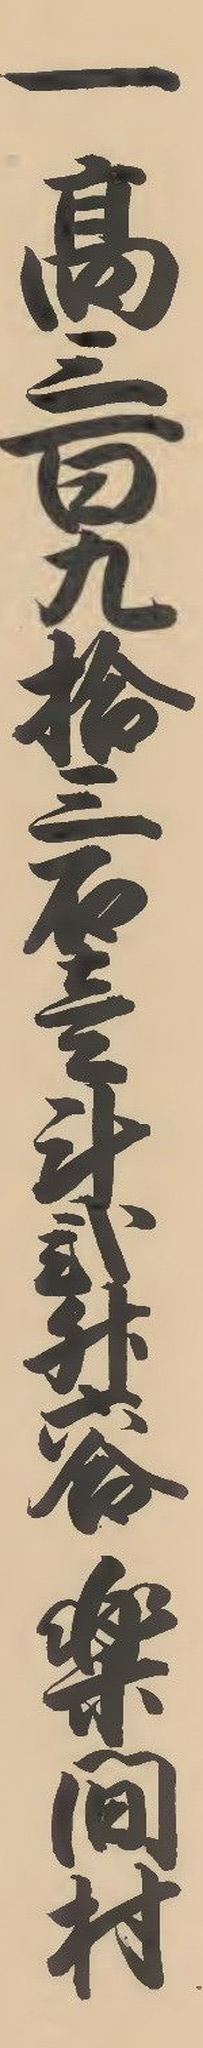一髙三百九拾三石壱斗弐升六合樂間村
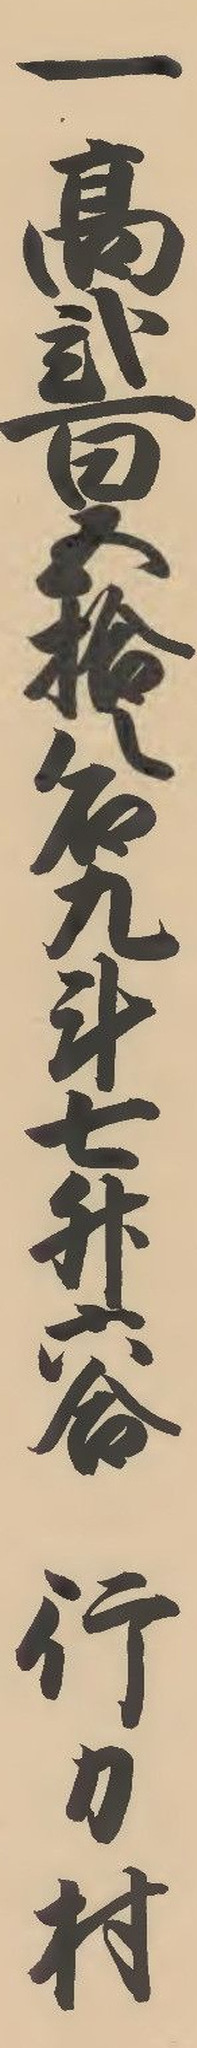一髙弐百五拾八石九斗七升六合行方村
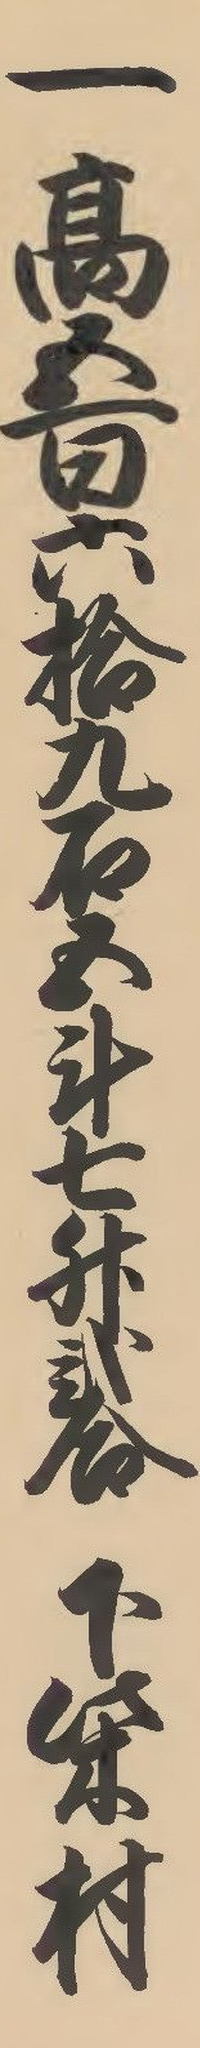一髙五百六拾九石五斗七升弐合下柴村

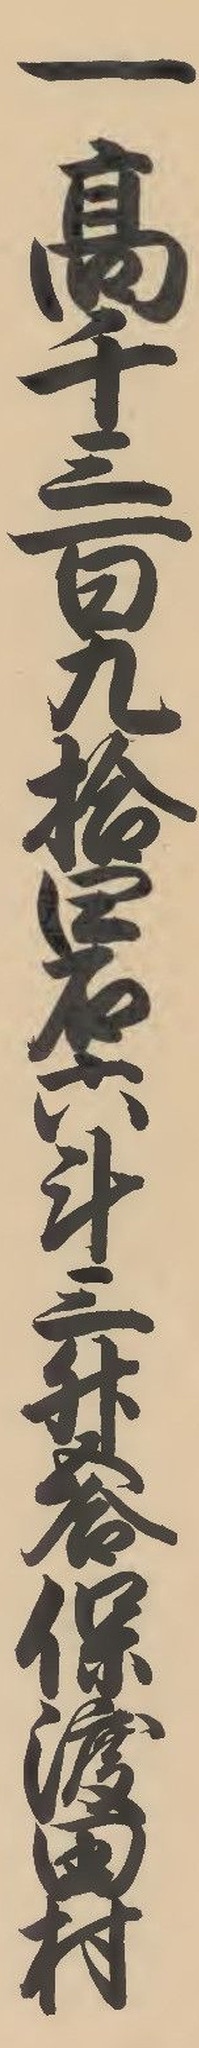一髙千三百九拾四石六斗三升五合保渡田村
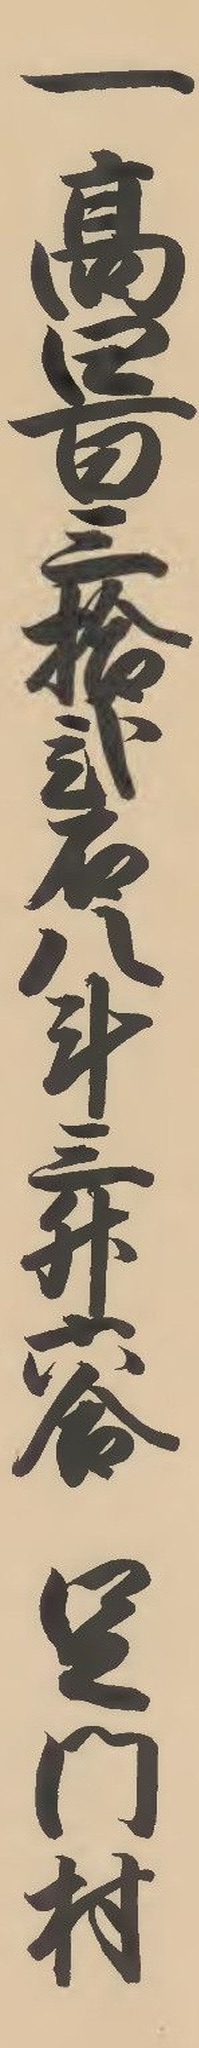一髙四百三拾弐石八斗三升六合足門村
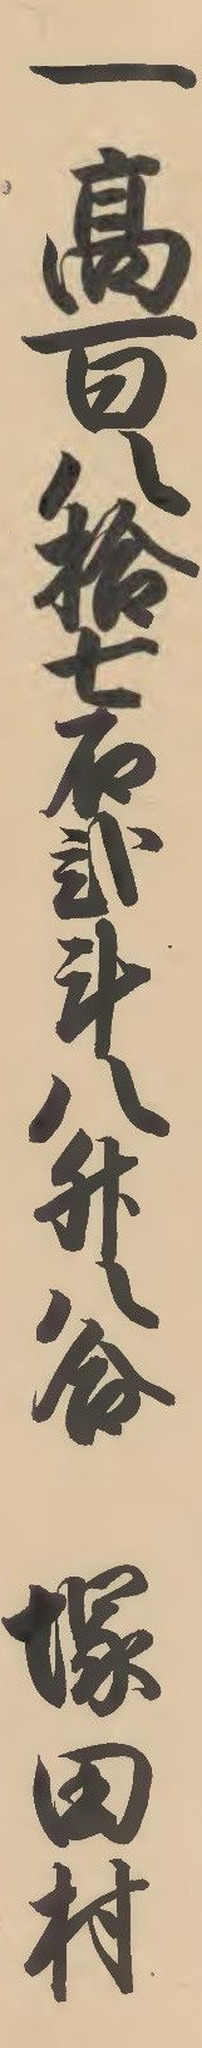一髙百八拾七石弐斗八升八合塚田村
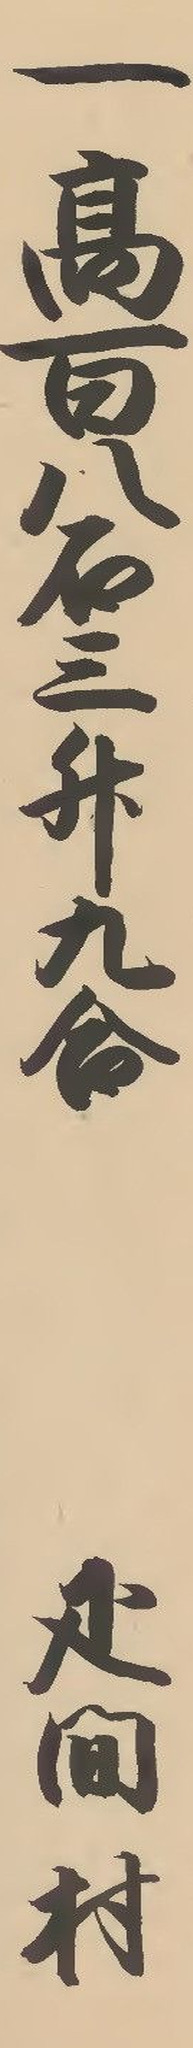一髙百八石三升九合疋間村
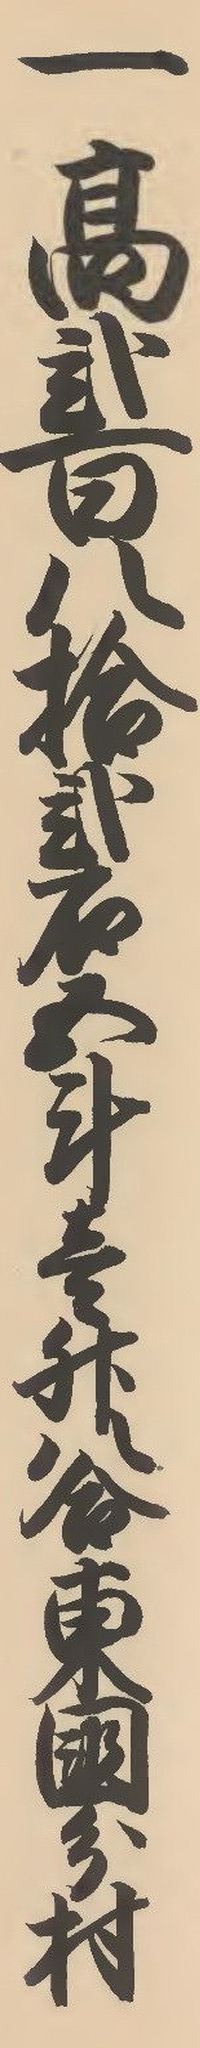一髙弐百八拾弐石五斗壱升八合東国分村
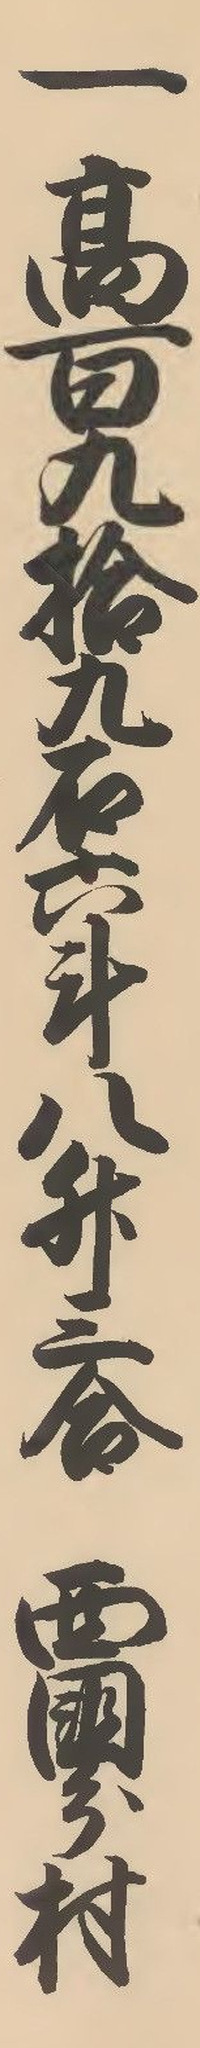一髙百九拾九石六斗八升三合西国分村
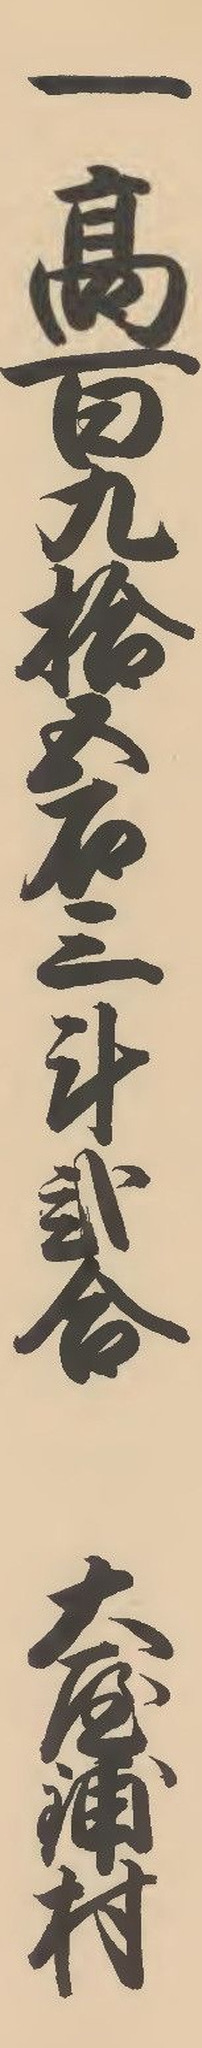一髙百九拾五石三斗弐合大屋浦村
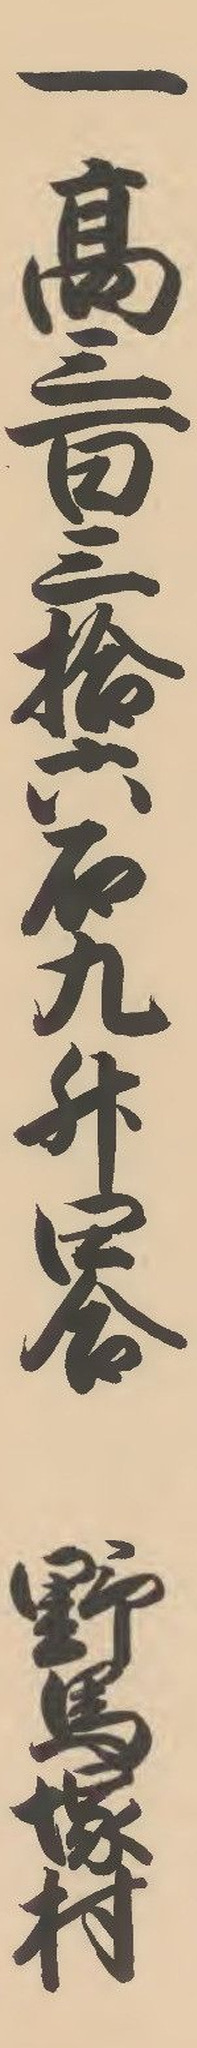一髙三百三拾六石九升四合野馬塚村

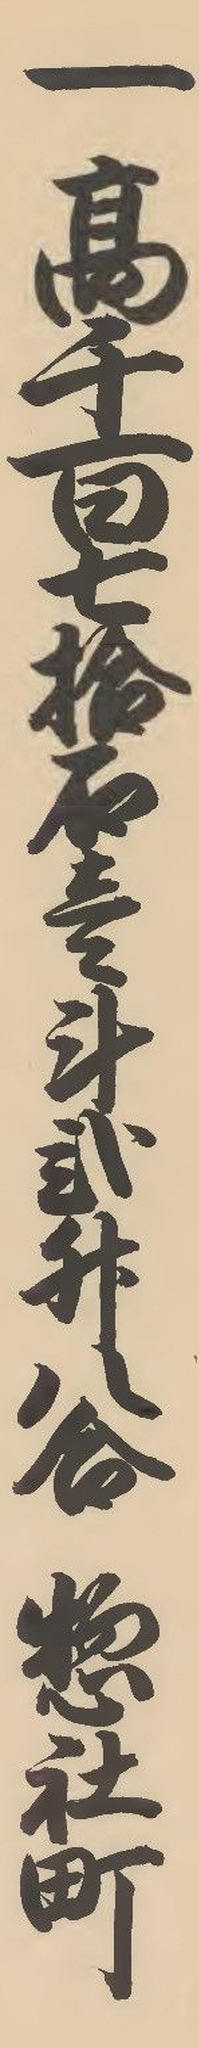一髙千百七拾石壱斗弐升八合惣社町
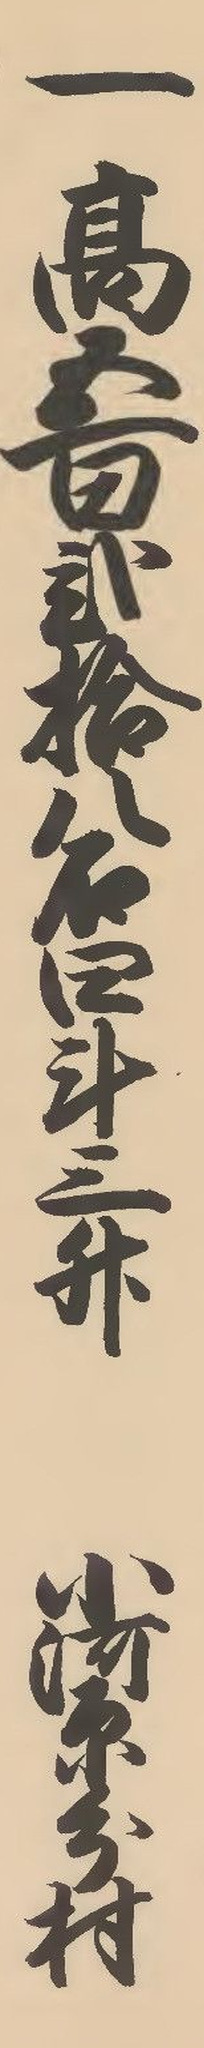一髙五百弐拾八石四斗三升小河原分村
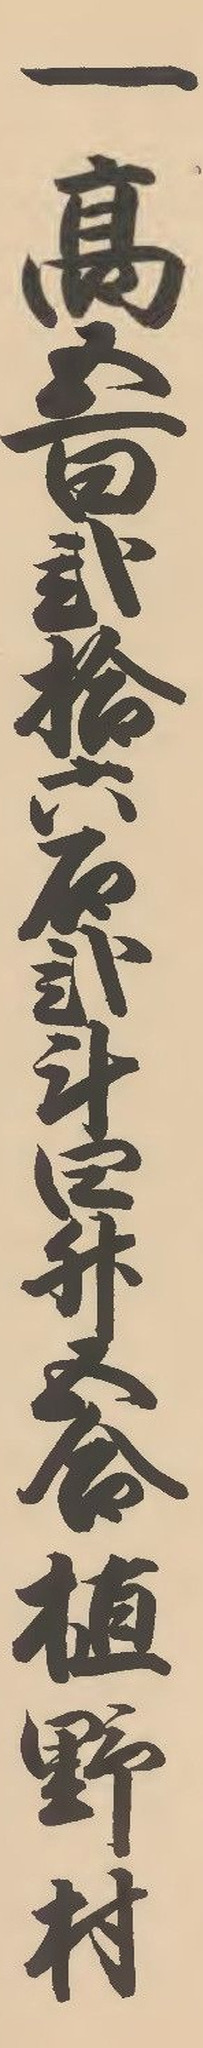一髙五百弐拾六石弐斗四升五合植野村
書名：上野国郷帳
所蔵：国立公文書館 National Archives of Japan
